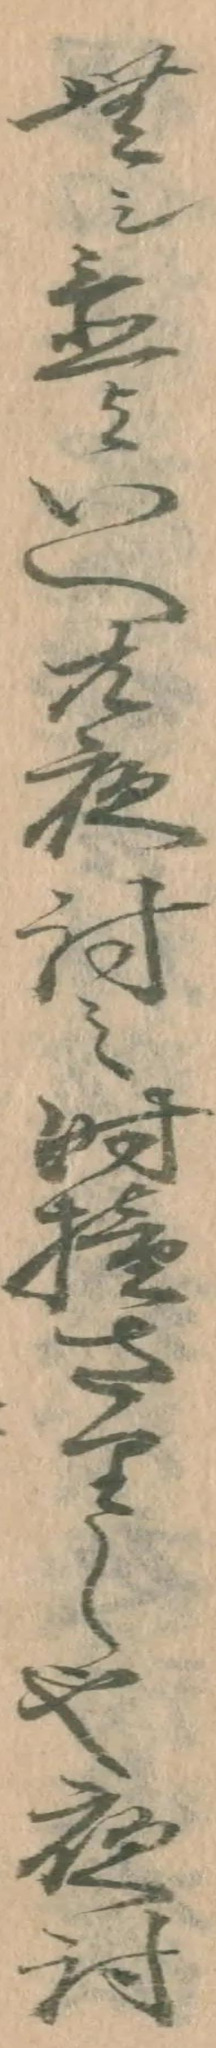無し置与いへ共夜討之時撞さ里しや夜討
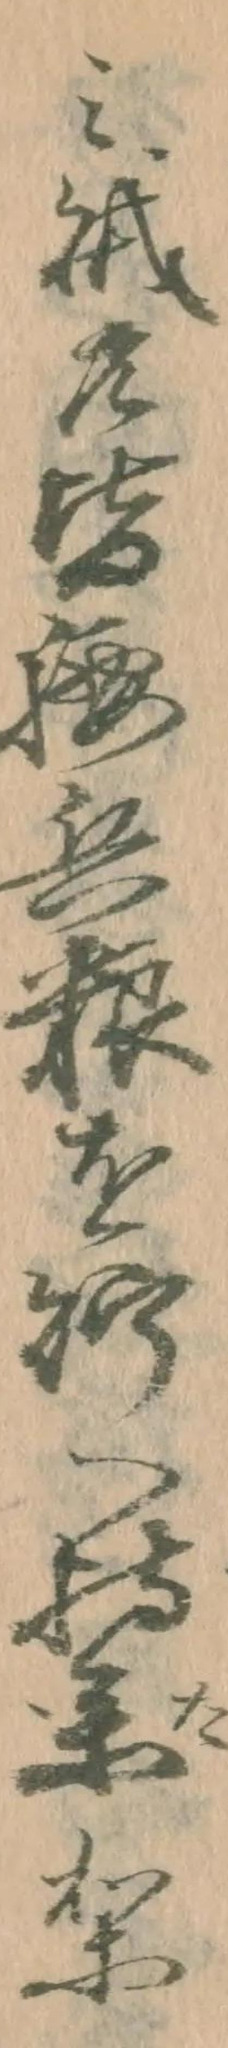之賊共皆腰兵粮を貯へ持参
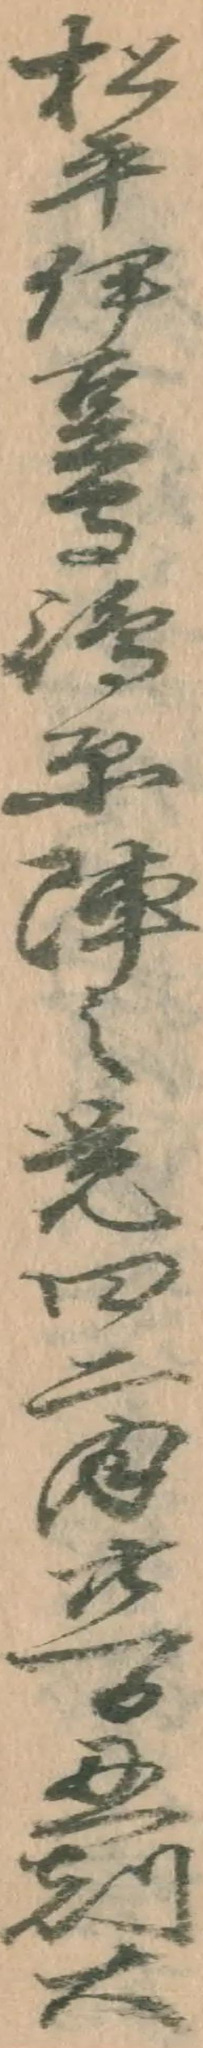松平伊豆守島原陣之覚曰二月廿一日丑刻大
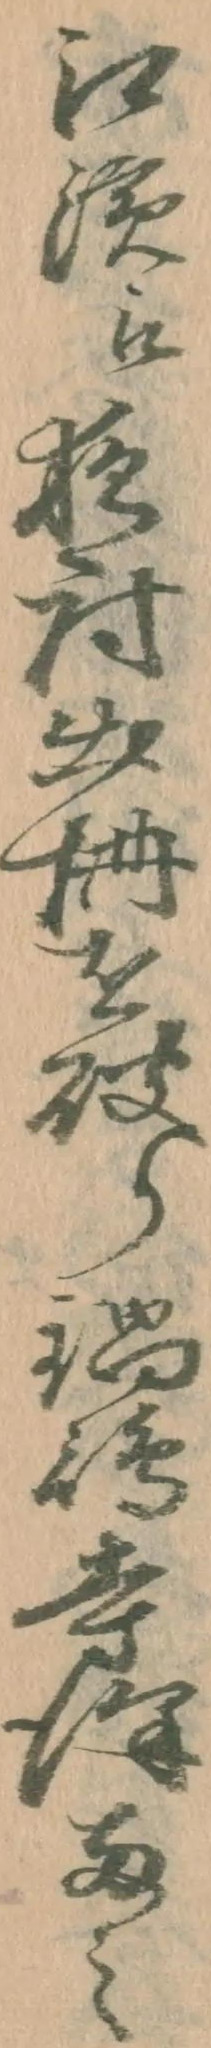江浜江夜討出柵を破り鍋島寺沢両之
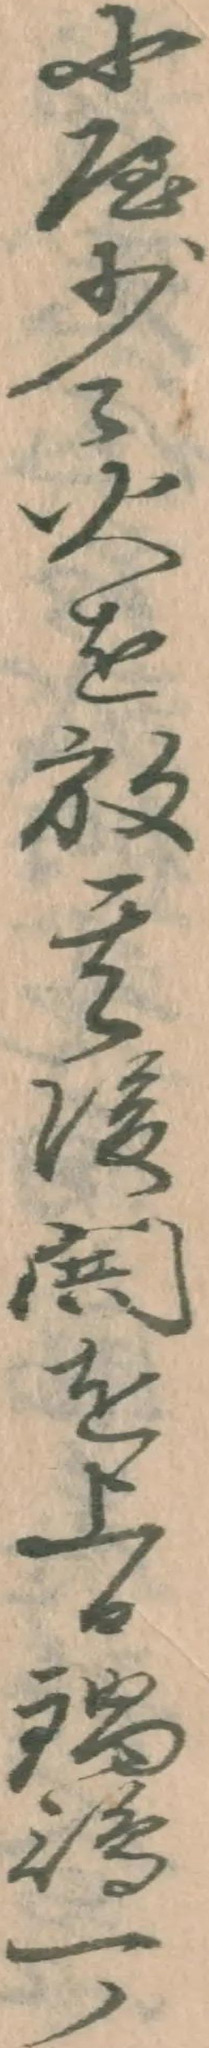小屋少々火を放其後鬨を上る鍋島一之
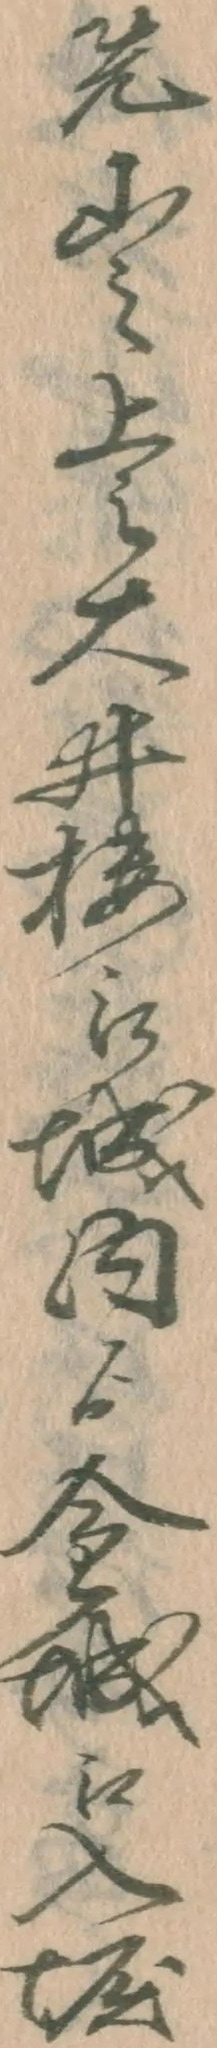先山之上之大井樓江城内ゟ金城江入堀
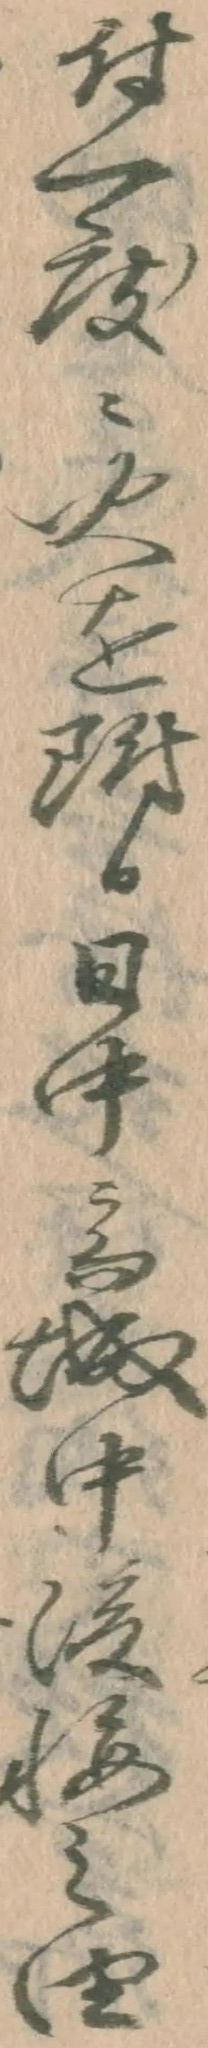付一度に火を附る日中に而城中後悔之由
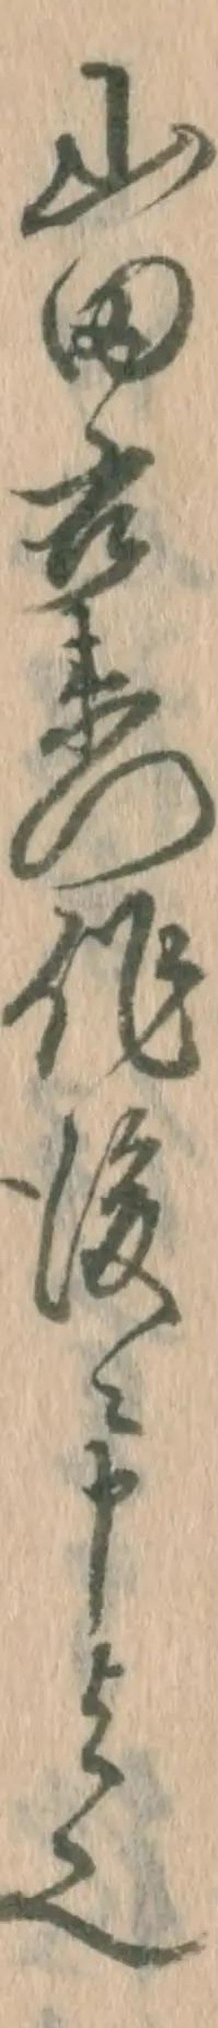山田右衛門作後に申与也
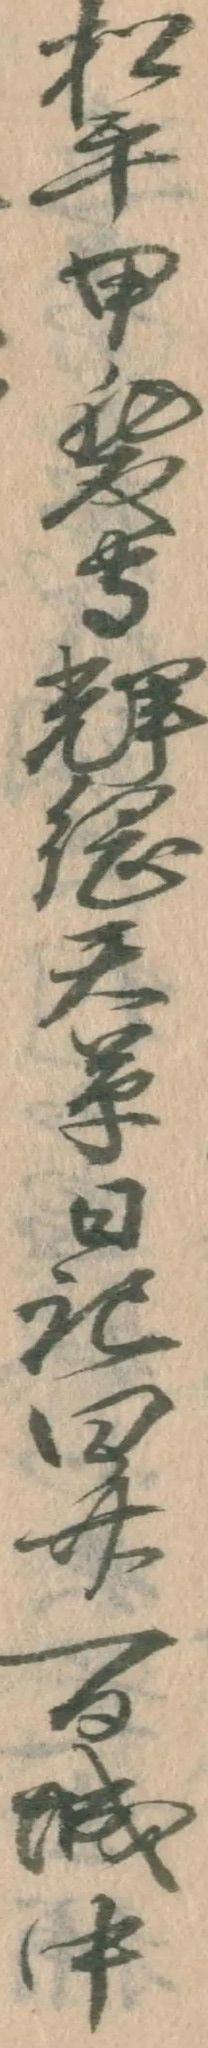松平甲斐守輝綱天草日記曰廿一日城中
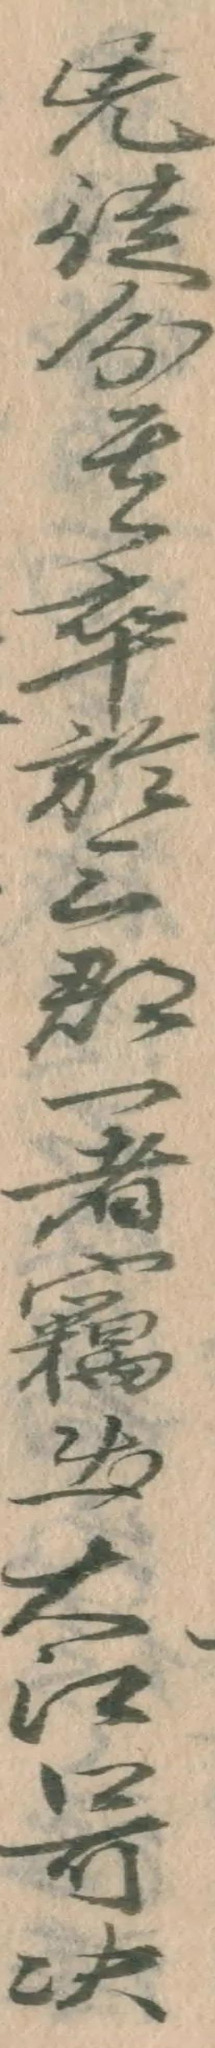兇徒分其卒於三郡一者竊出大江口可決
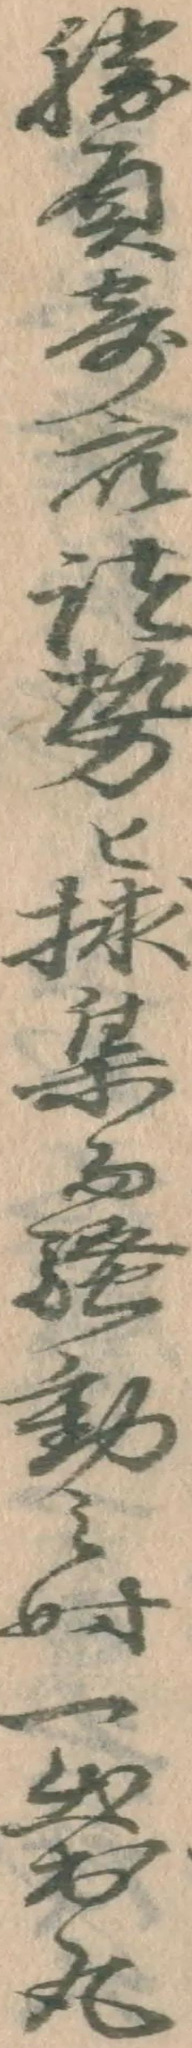勝負寄衆諸勢被捄集而騒動之時一出出丸
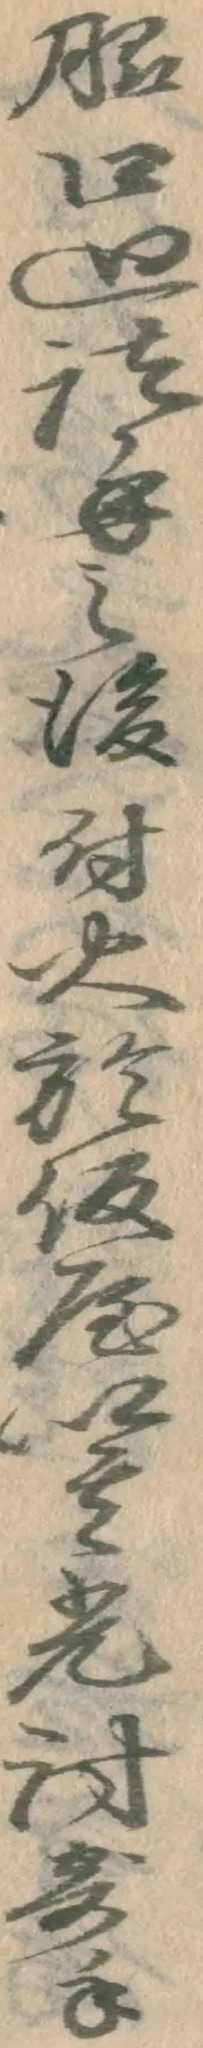脇口廻諸手之後付火於仮屋以其光討寄手
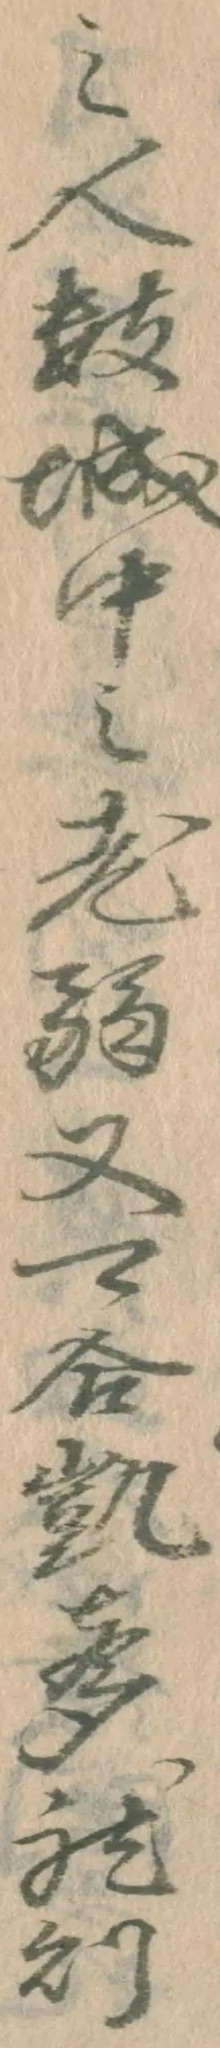之人数城中之老弱又可合凱声然刻
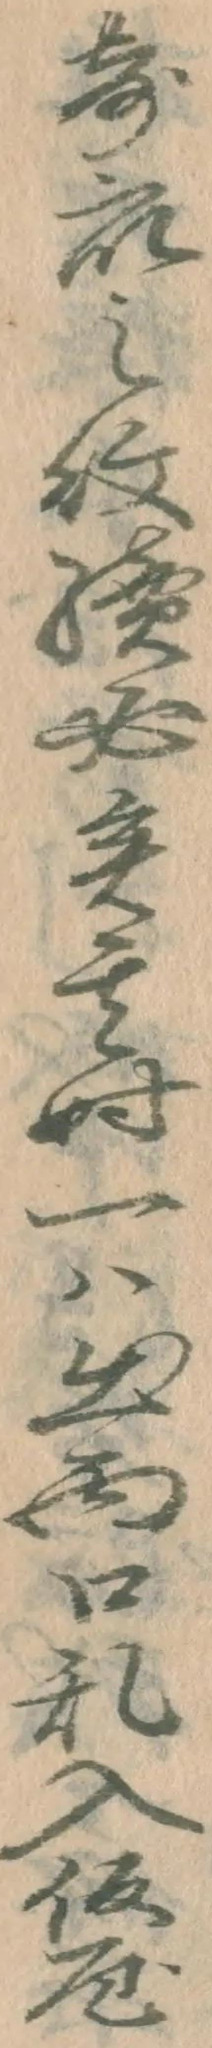寄衆之攻続必矣其時一は出両口乱入仮屋

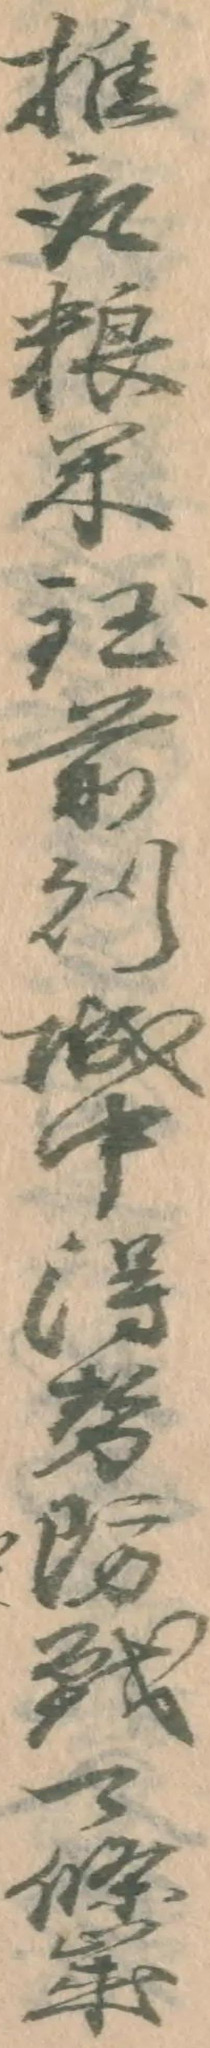推取粮米程前則城中得勢防戦可條歳
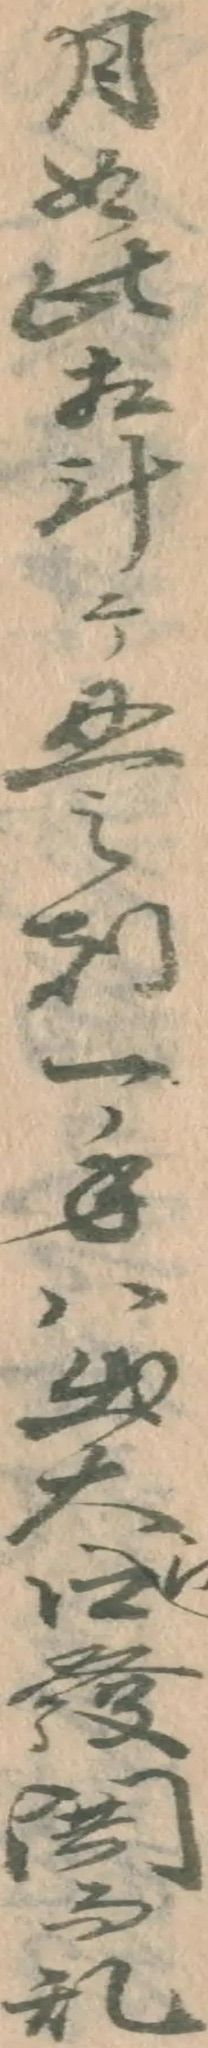月如此相計て丑之刻一手は出大江口発鬨而乱
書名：切支丹御退治記 49巻. [7]
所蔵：国立国会図書館 National Diet Library, JAPAN
